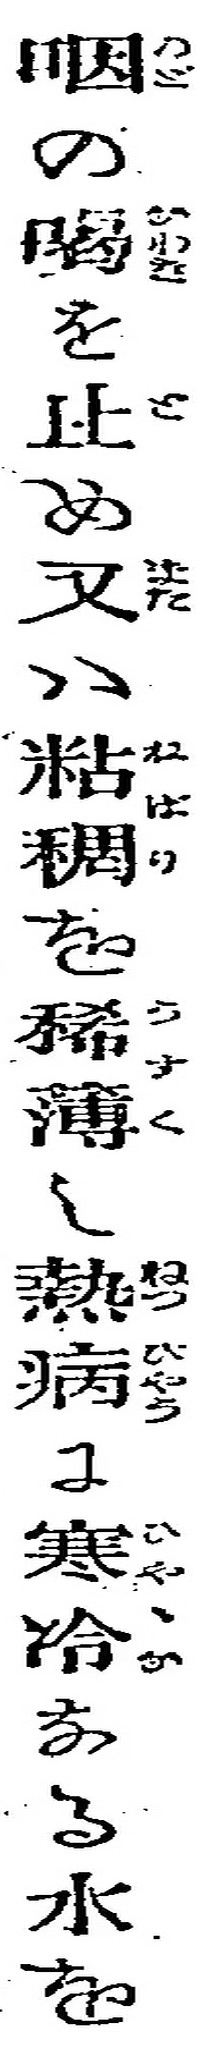咽の喝を止め又は粘稠を稀薄し熱病に寒冷なる水を

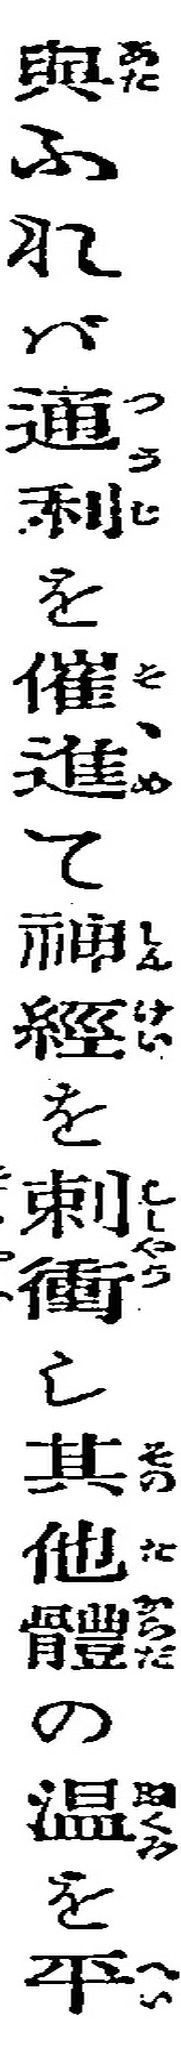與ふれば通利を催進て神経を刺衝し其他體の温を平
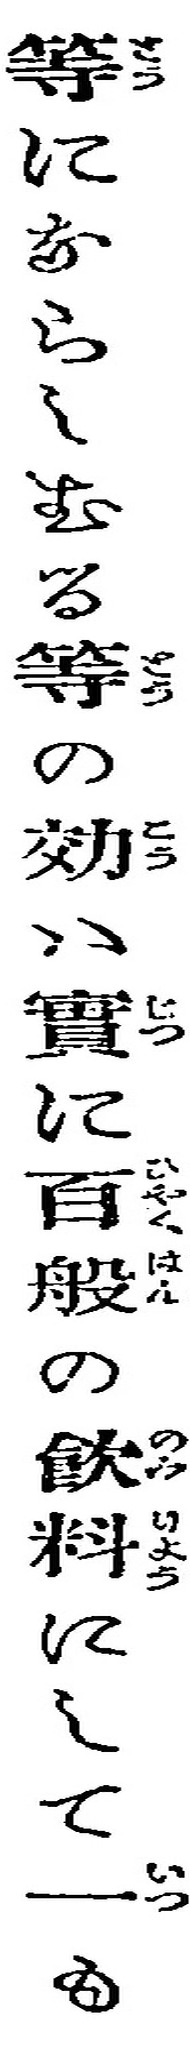等にならしむる等の効は實に百般の飲料にして一も
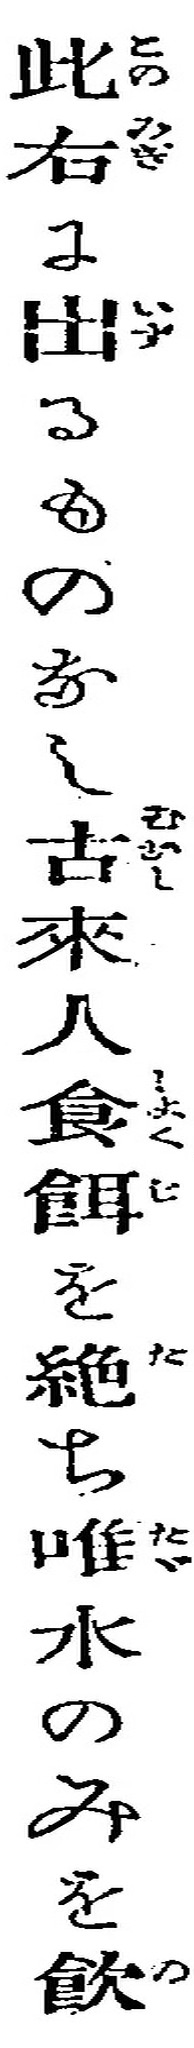此右に出るものなし古來人食餌を絶ち唯水のみを飲
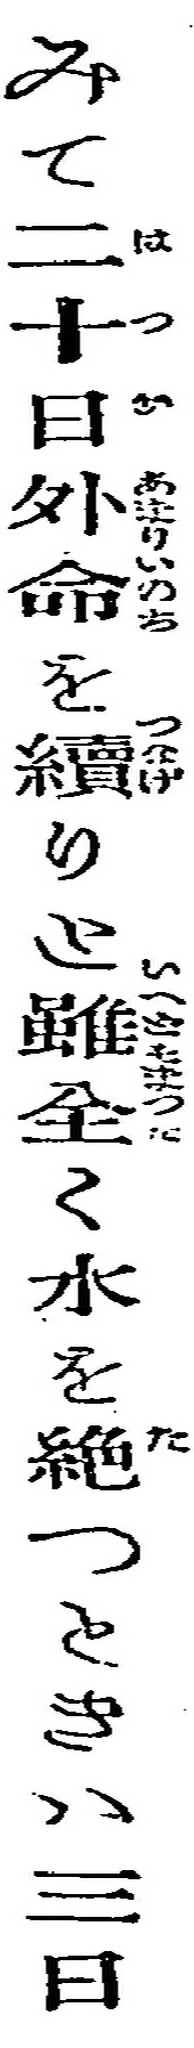みて二十日外命を續りと雖全く水を絶つときは三日
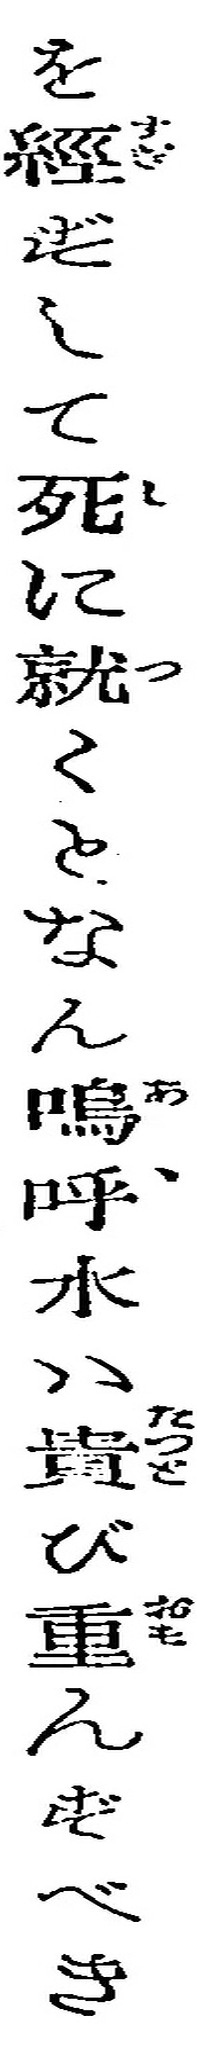を経ずして死に就くとなん嗚呼水は貴び重んずべき
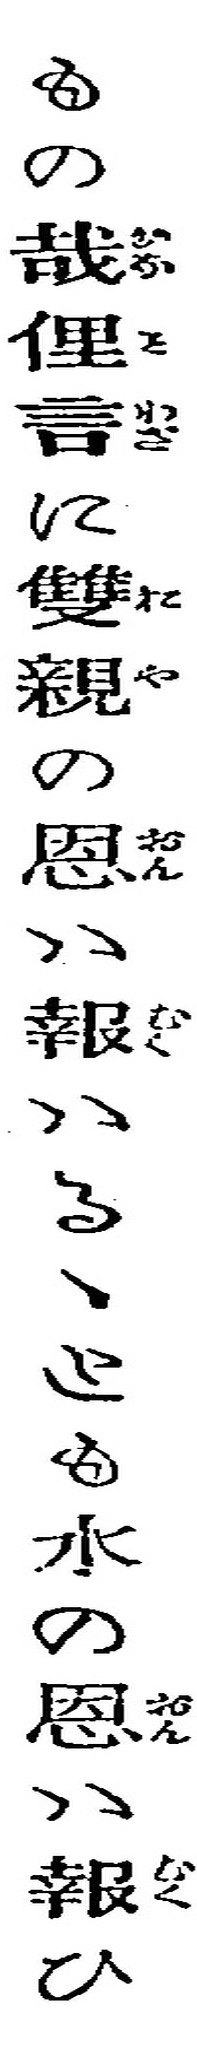もの哉俚言に雙親の恩は報はるゝとも水の恩は報ひ
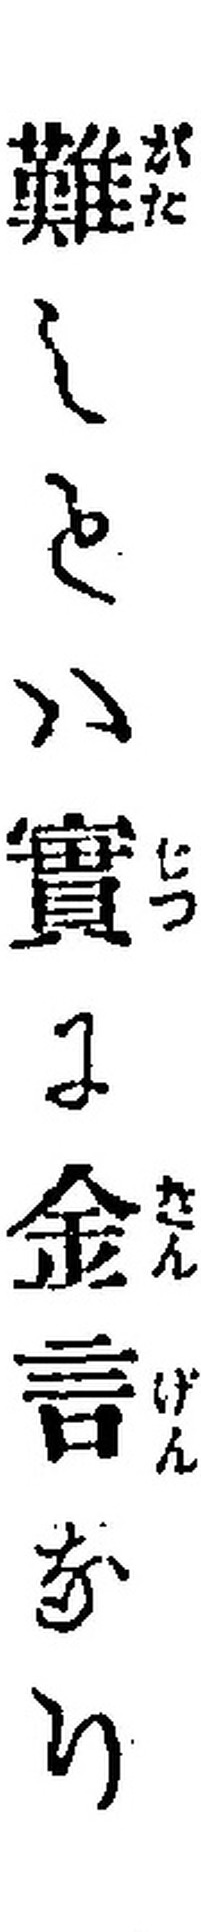難しとは實に金言なり
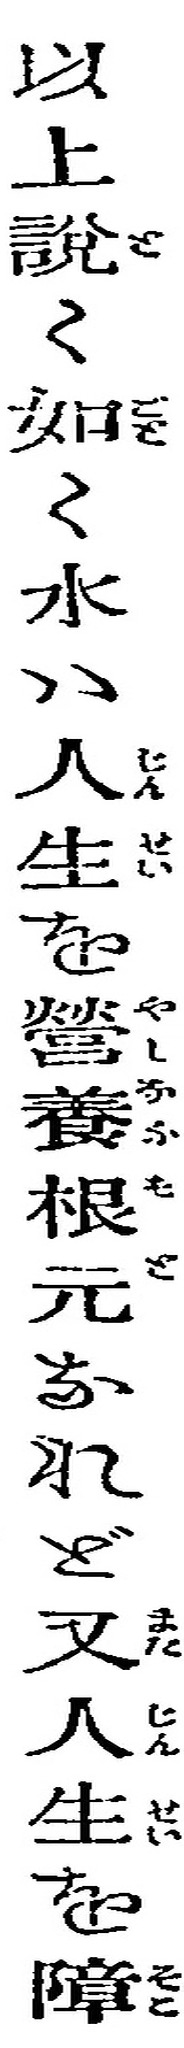以上説く如く水は人生を營養根元なれど又人生を障
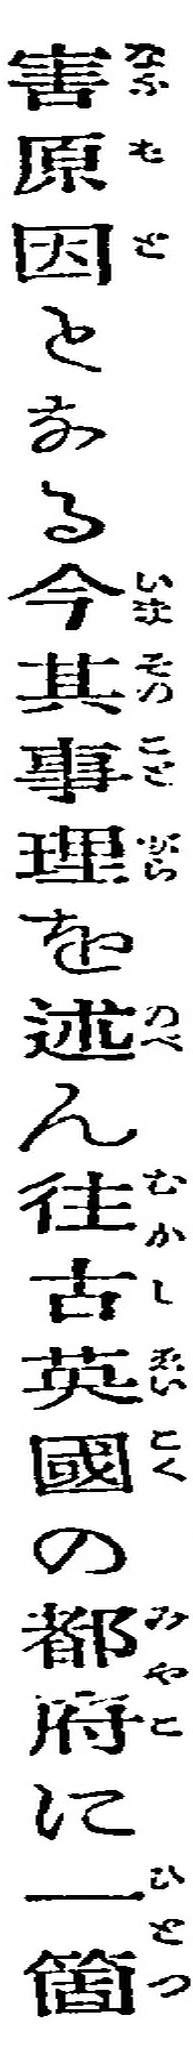害原因となる今其事理を述ん往古英国の都府に一箇
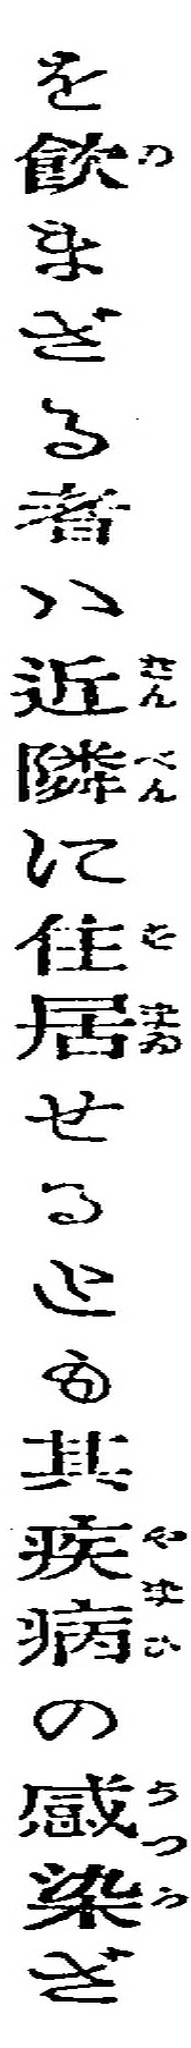を飲まざる者は近隣に住居せるとも其疾病の感染ざ
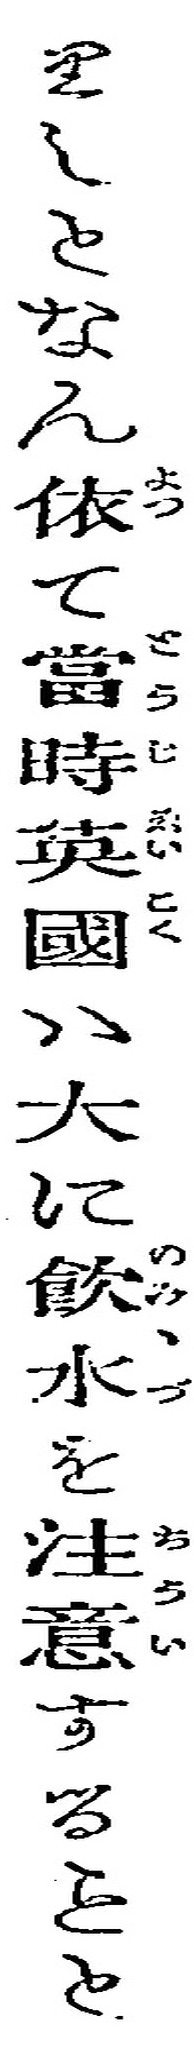りしとなん依て当時英国は大に飲水を注意することと
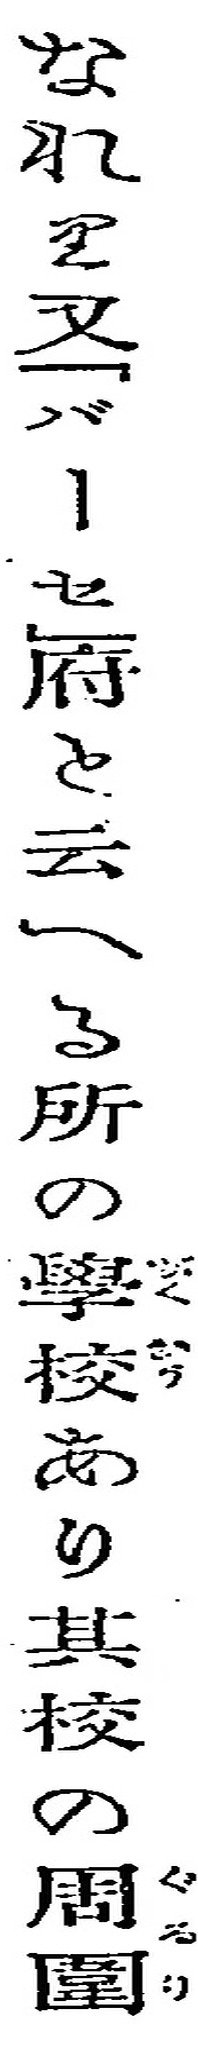なれり又[バーセ]府と云へる所の学校あり其校の周圍
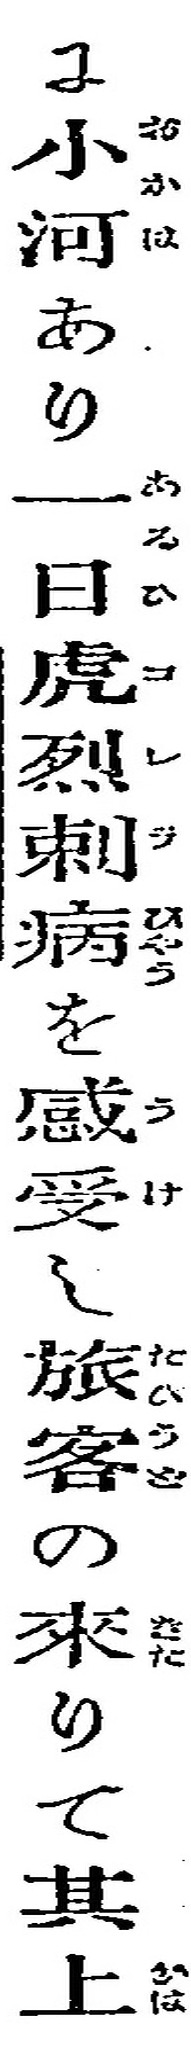に小河あり一日虎列刺病を感受し旅客の来りて其上
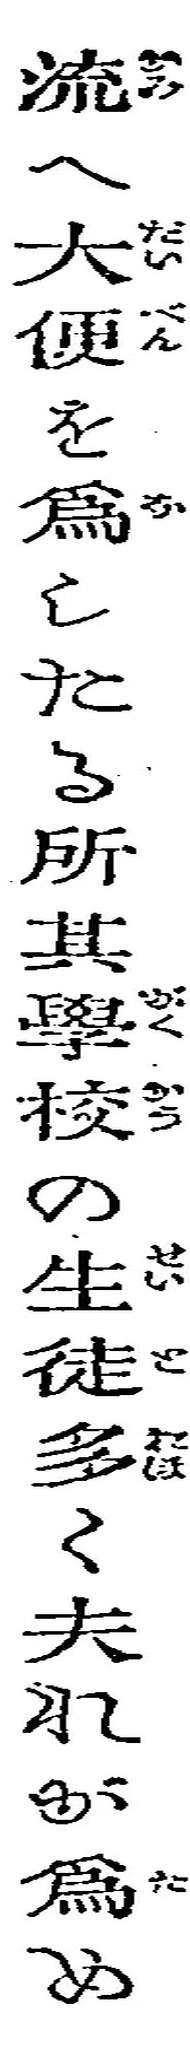流へ大便を為したる所其学校の生徒多く夫れが為め
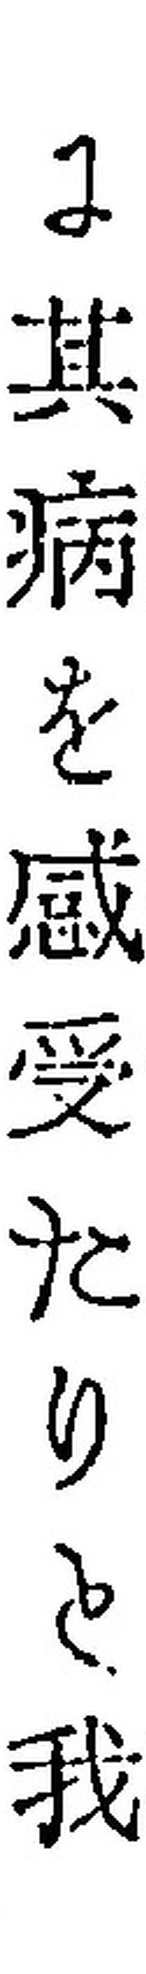に其病を感受たりと我
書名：飲水の心得 : 伝染病の予防
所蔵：国立国会図書館 National Diet Library, JAPAN
